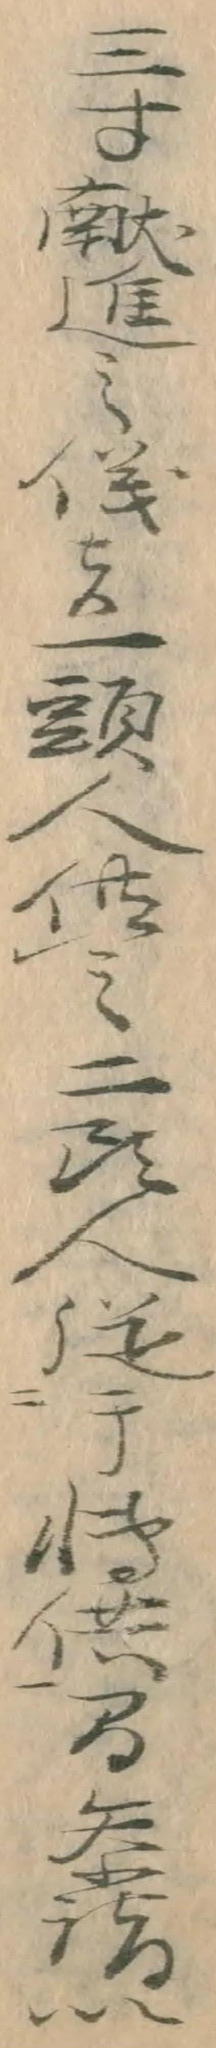三寸献進之儀者一頭人供之二頭人従于轉供間参詣以

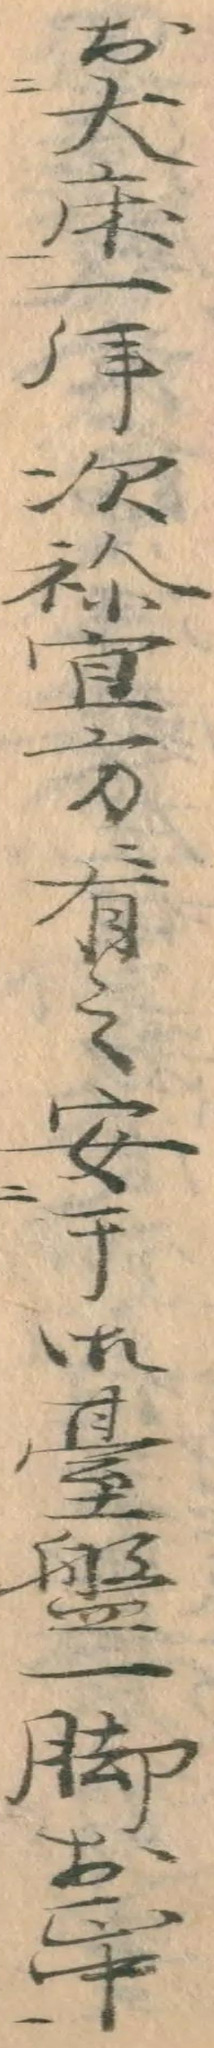於大床一拝次祢宜方ニ有之安于御臺盤一脚於正中
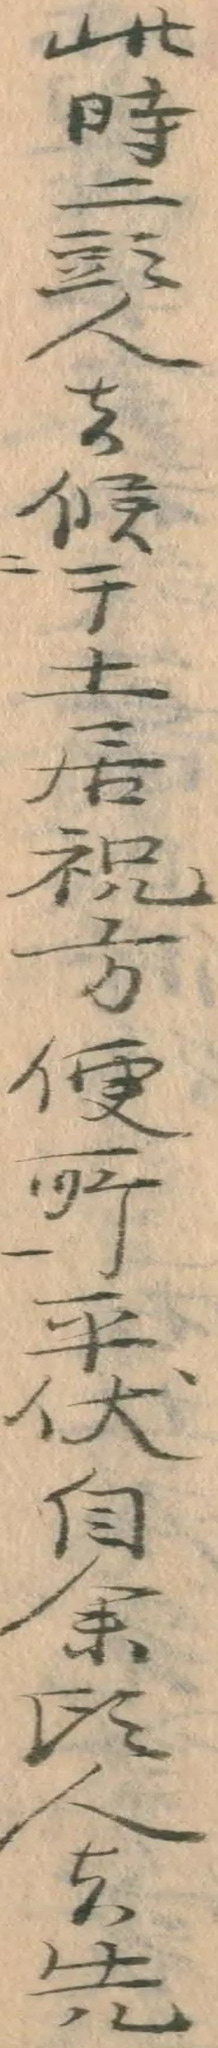此時二頭人者候于土居祝方便所平伏自余頭人者先
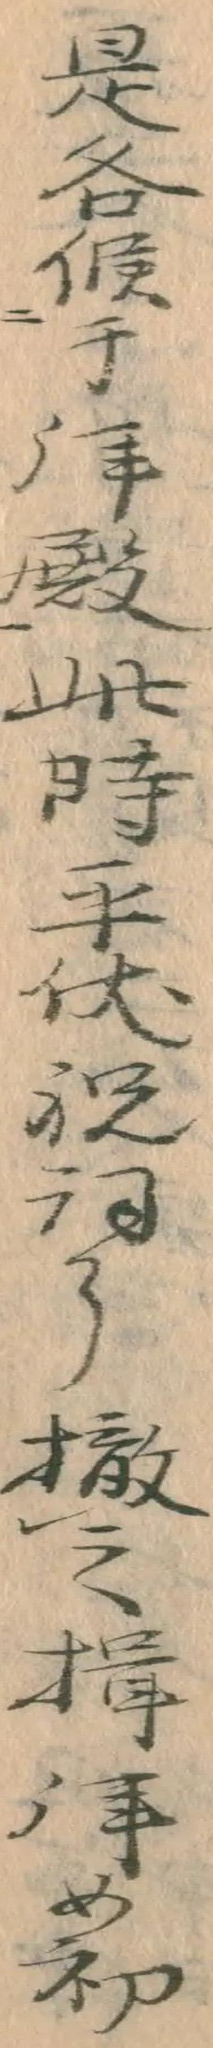是各侯于拝殿此時平伏祝詞終了撒之揖拝如初
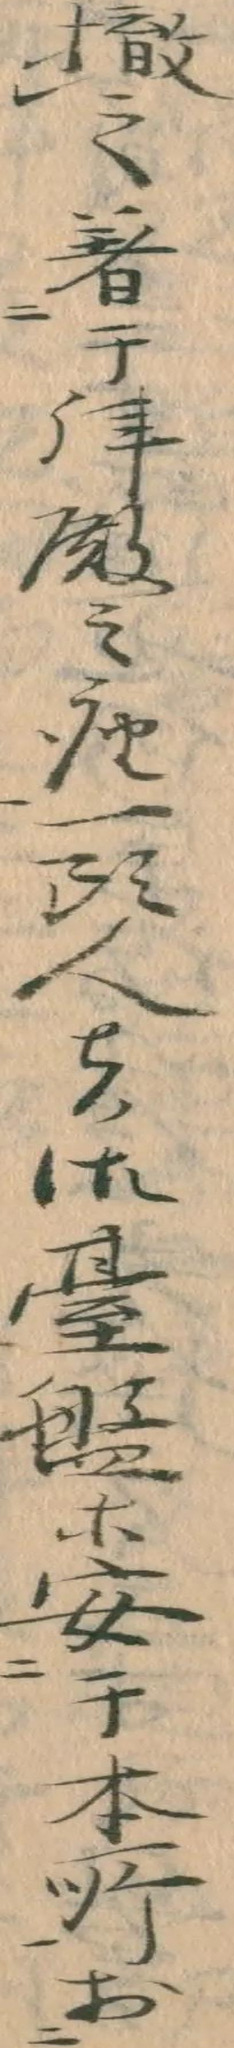撒之着于拝殿之座一頭人者御臺盤等安于本所於
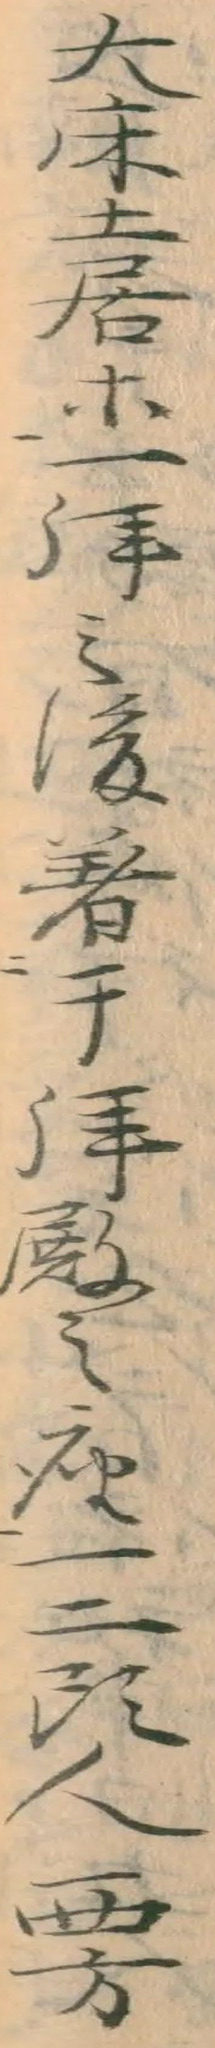大床土居等一拝之後着于拝殿之座一二頭人西方
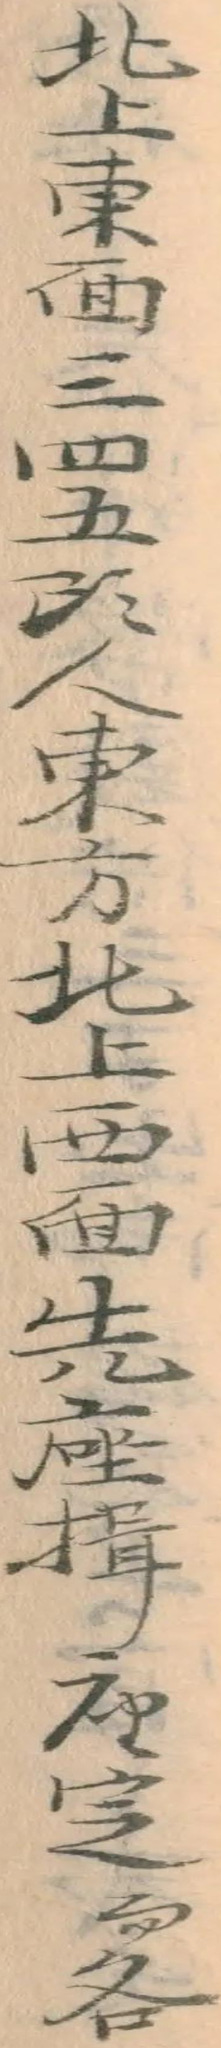北上東面三四五頭人東方北上西面先座揖座定而各
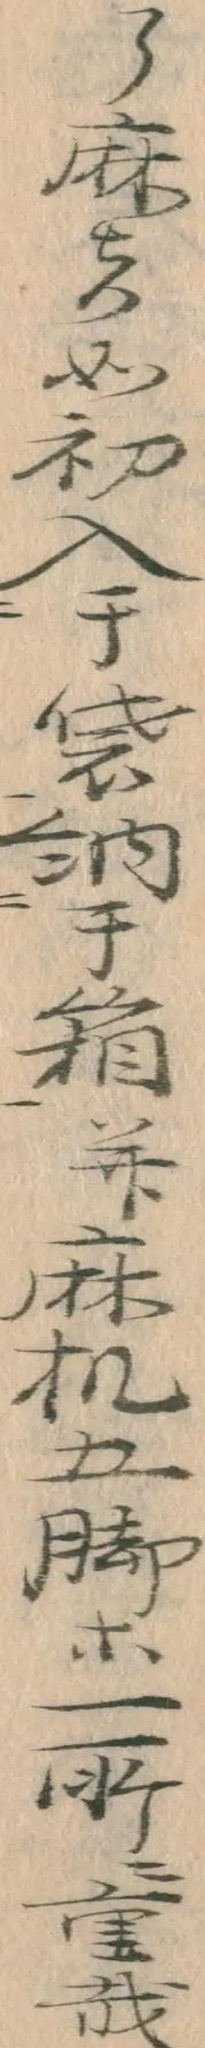了麻者如初入于袋納于箱并麻机五脚等一所ニ重載
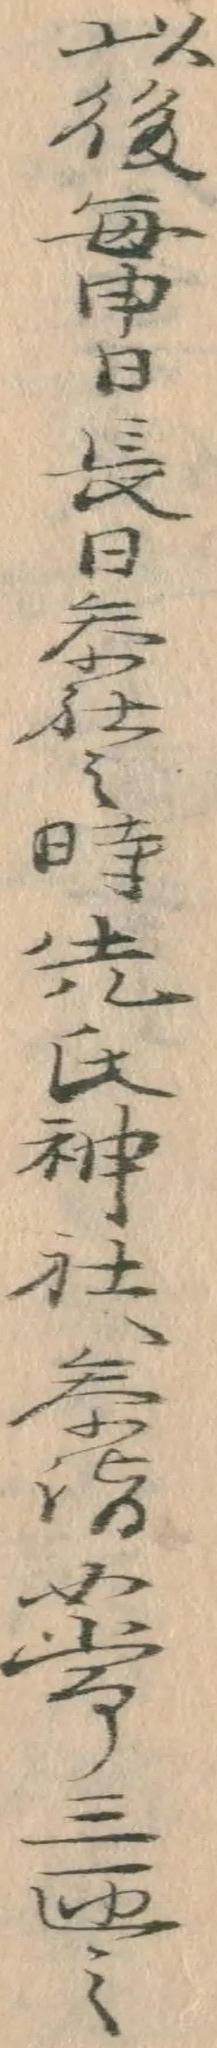以後毎申日長日参社之時先氏神社へ参詣如常三匝也
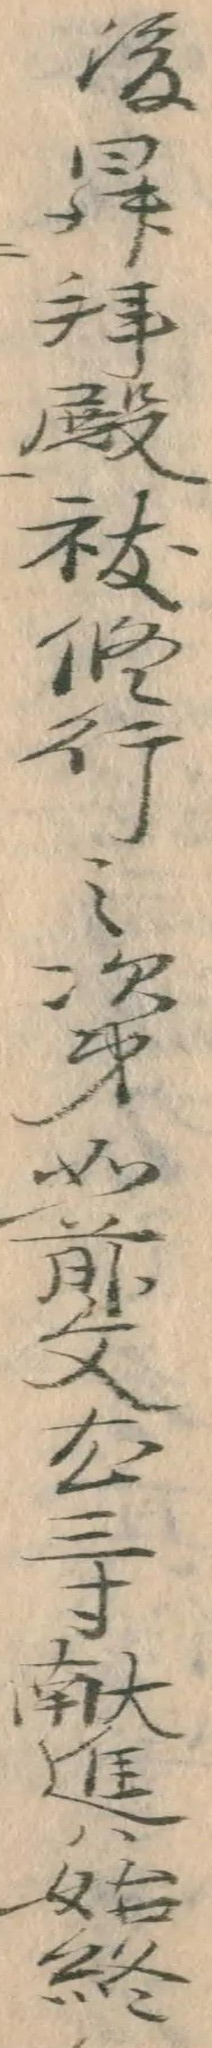後昇拝殿被修行之次第如前文尤三寸献進ハ始終斗也
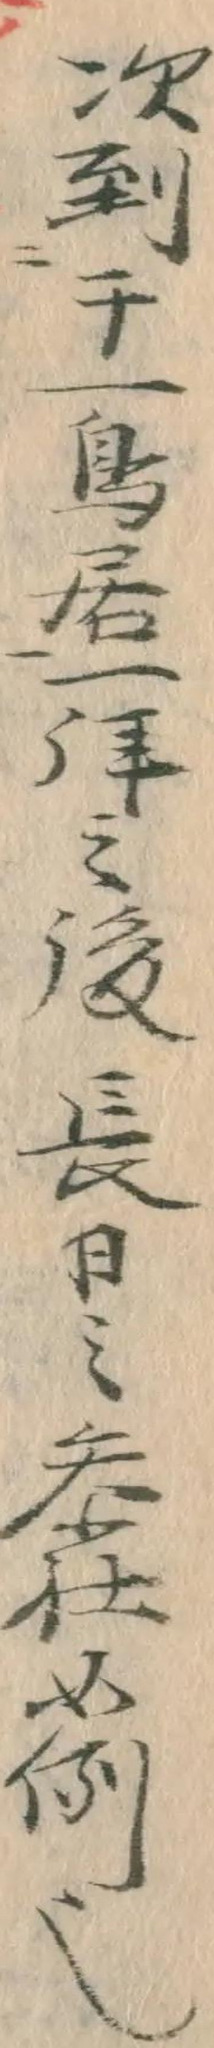次到于一鳥居一拝之後長日之参社如例也
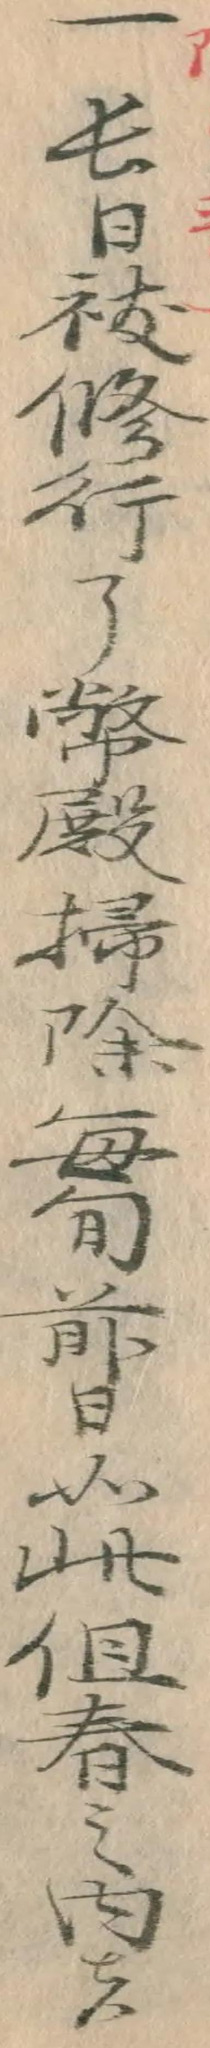一長日祓修行了幣殿掃除毎旬前日如此但春之内者

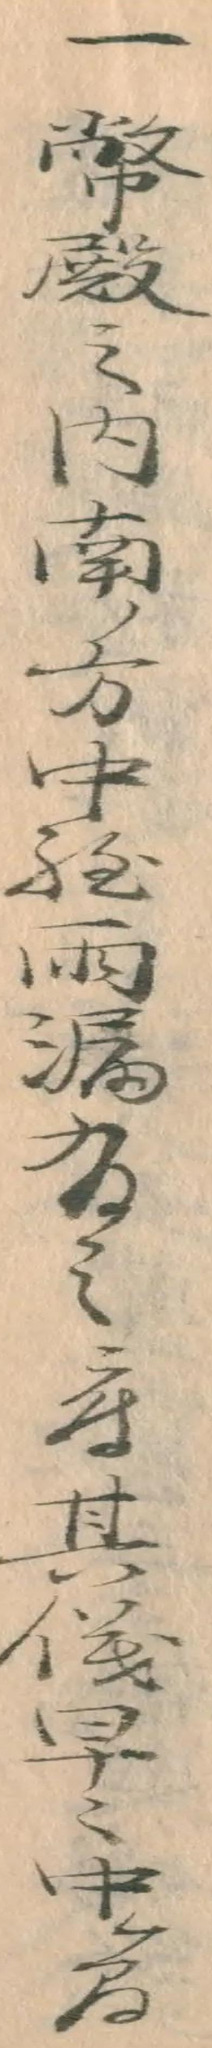一幣殿之内南の方中程雨漏有之ニ付其儀早々中ケ間
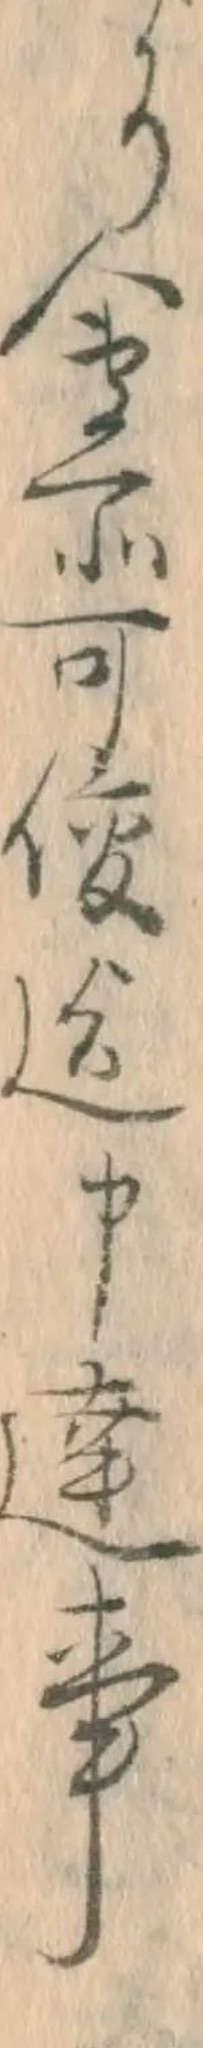より會所可俊迄申達事
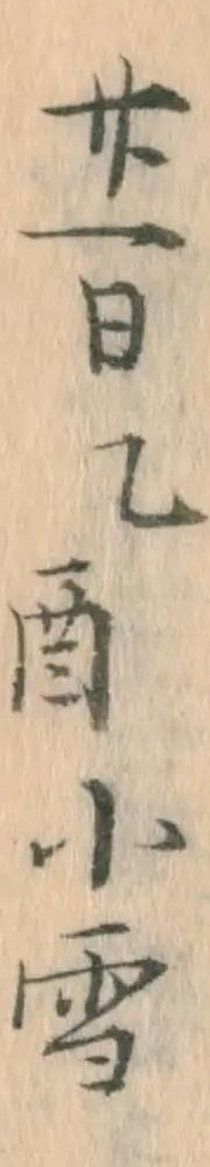廿一日乙酉小雪
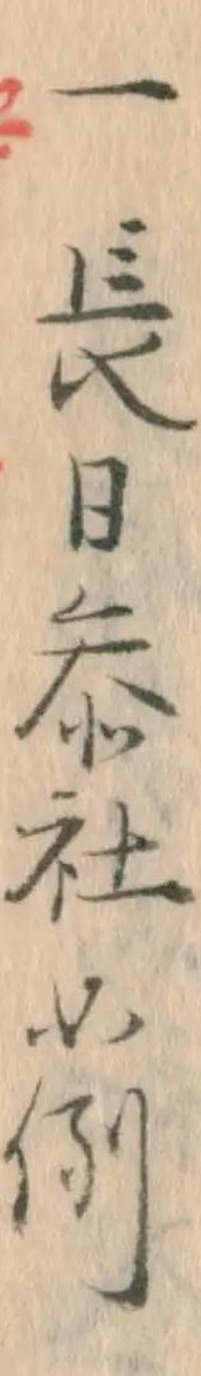一長日参社如例
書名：賀茂社記録. 第72冊
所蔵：国立国会図書館 National Diet Library, JAPAN
